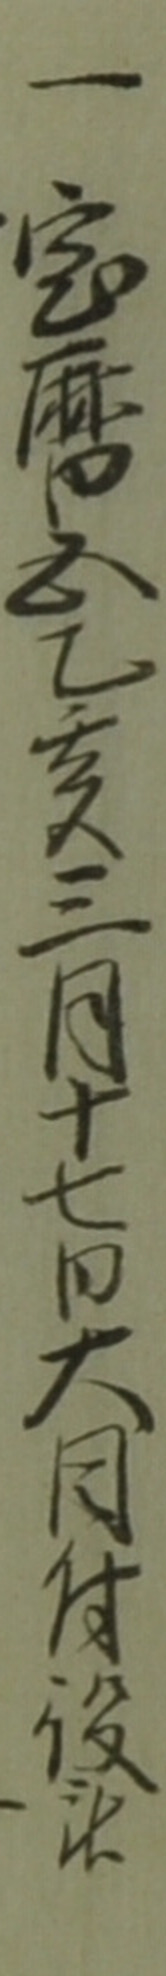一宝暦五乙亥三月十七日大目付役被
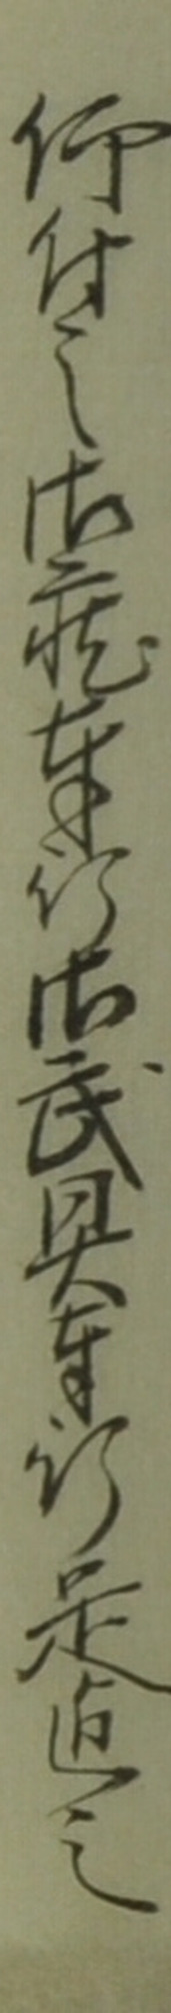仰付之御蔵奉行御武具奉行是迄之

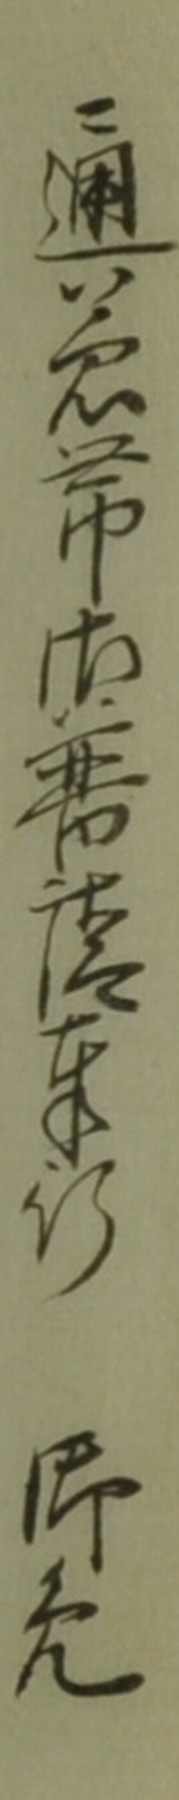通兼帯御普請奉行御免
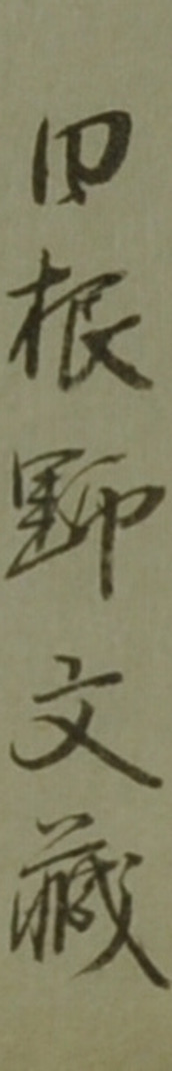日根野文蔵
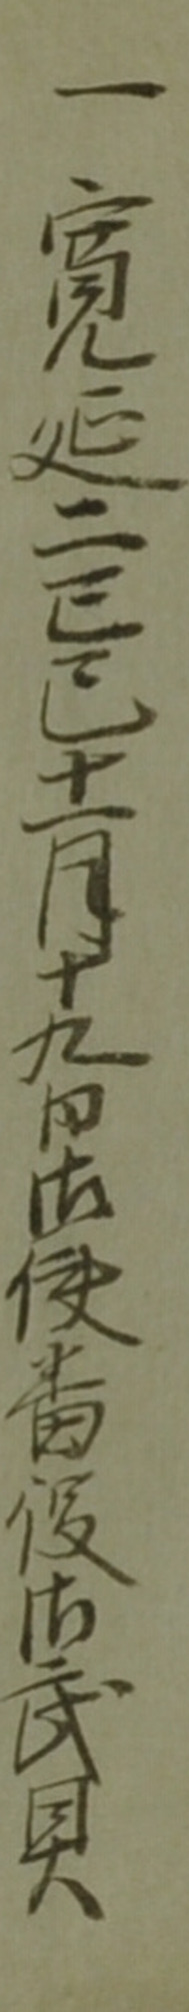一寛延二己巳十一月十九日御使番役御武具
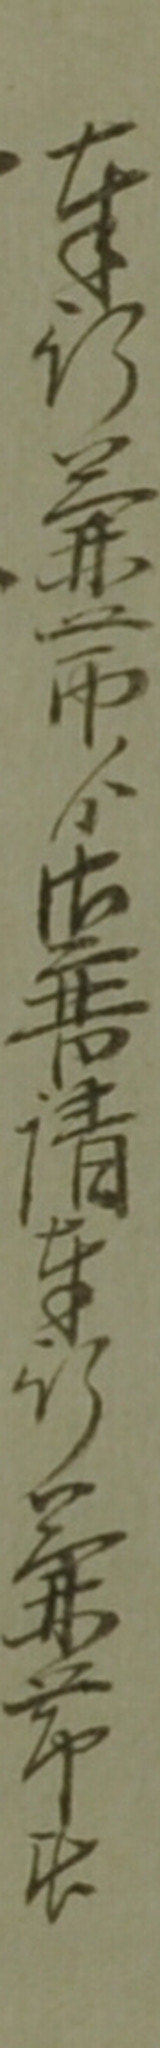奉行兼帯ゟ御普請奉行兼帯被
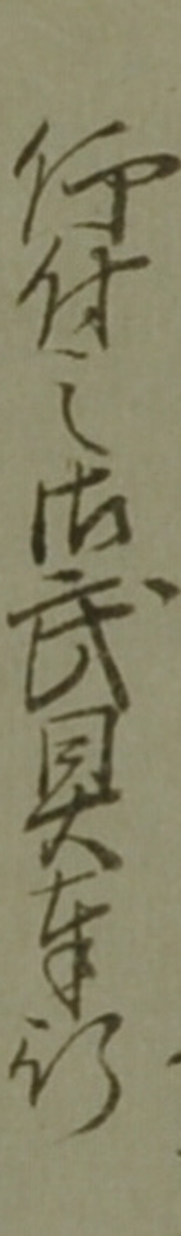仰付之御武具奉行御免
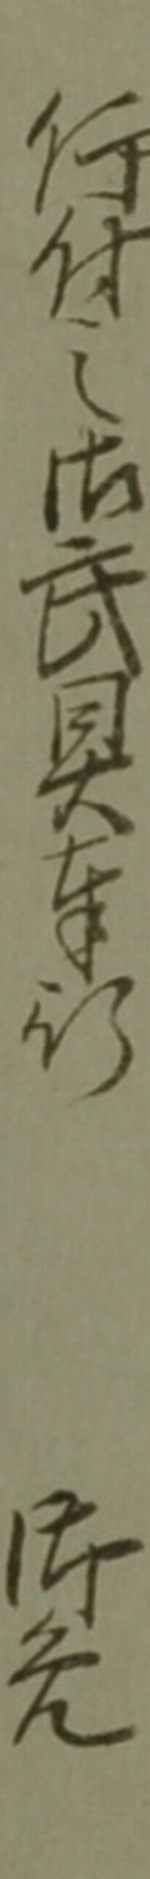仰付之御武具奉行御免
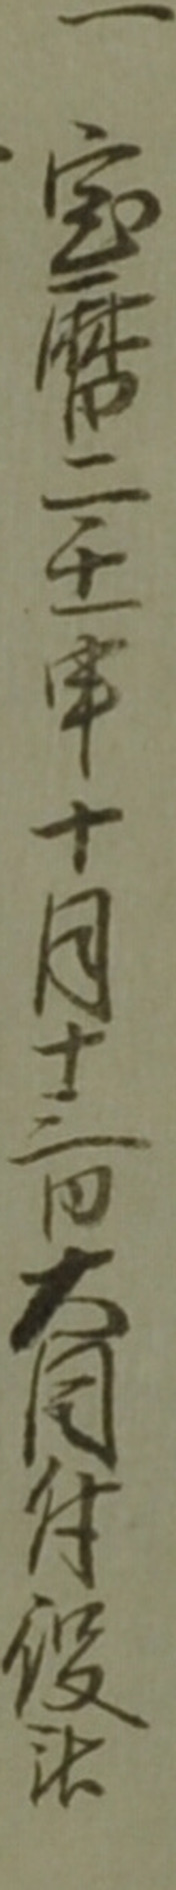一宝暦二壬申十月十三日大目付役被
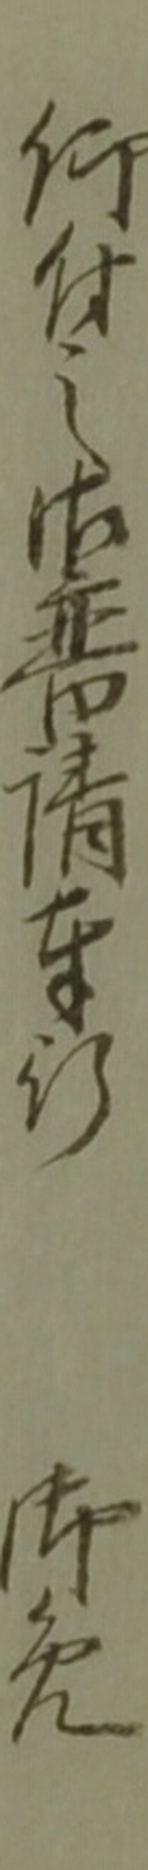仰付之御普請奉行御免
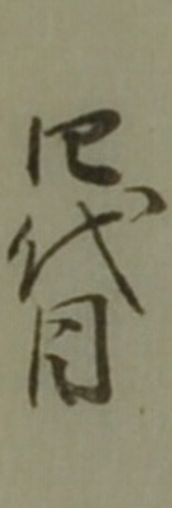四代目
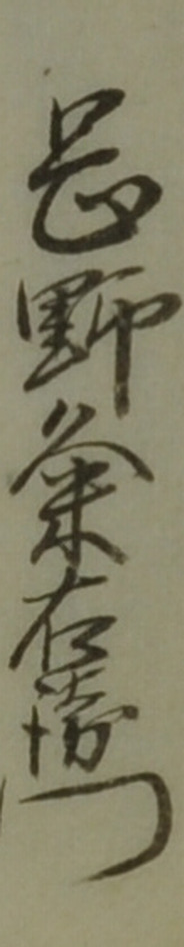岡野粂右衛門
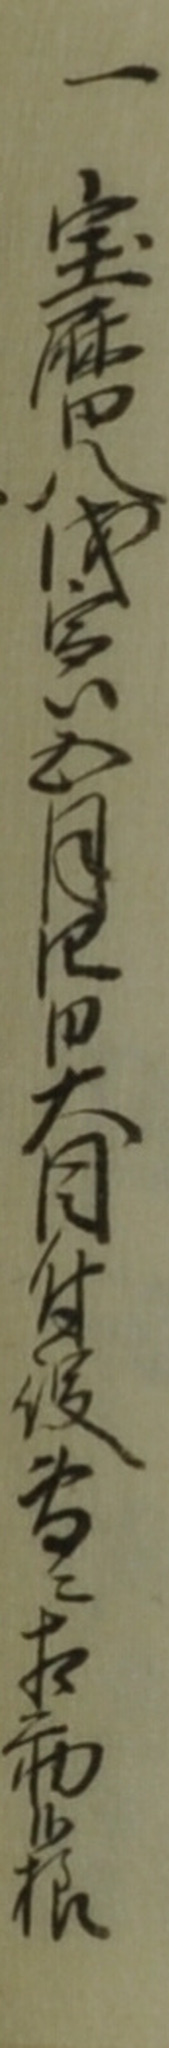一宝暦八戊寅五月四日大目付役専ニ相勤候様
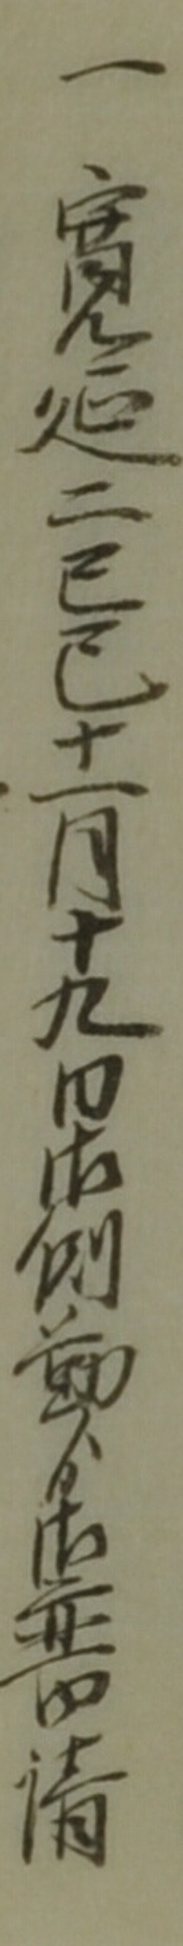一寛延二己巳十一月十九日御側勤ゟ御普請
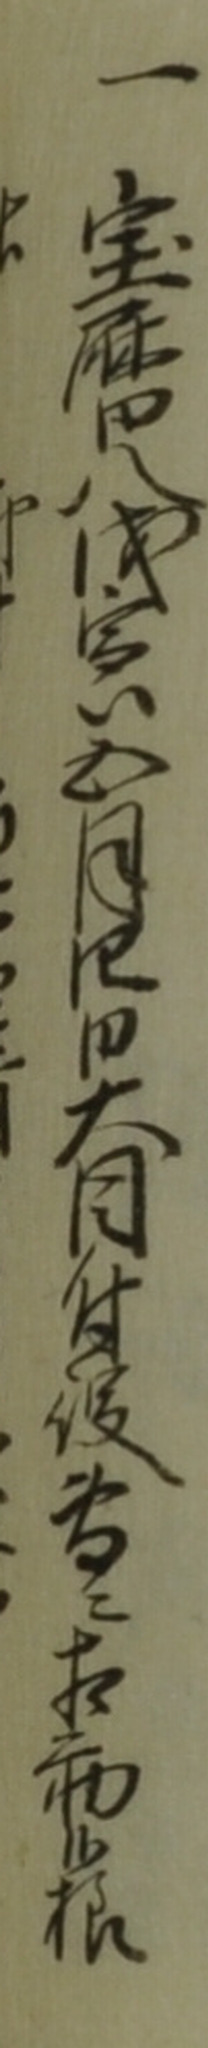一宝暦八戊寅五月四日大目付役専ニ相勤候様
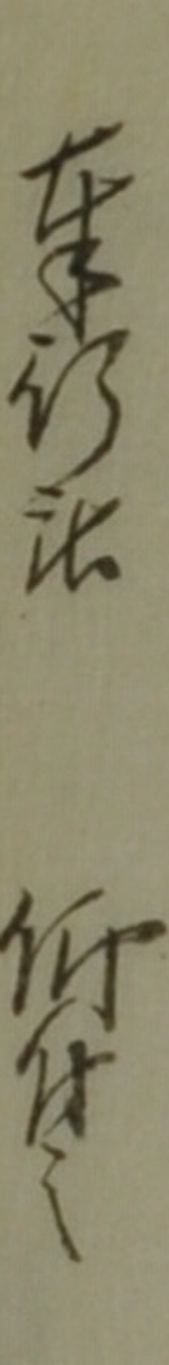奉行被仰付之
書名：諸御役代々録（六）
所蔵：伊那市立高遠町図書館・合同会社AMANE
